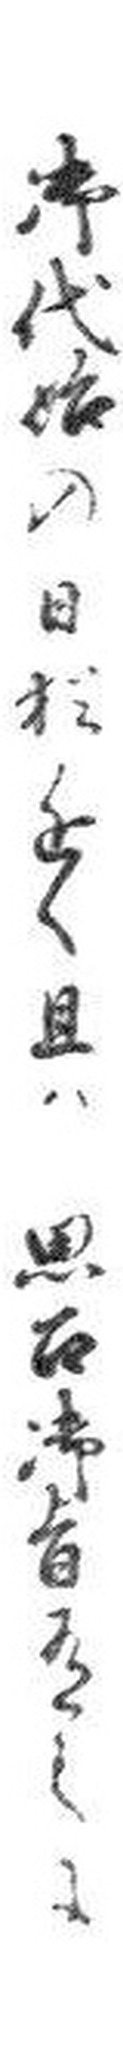御代始の日猶近く且ハ思召御旨有之に
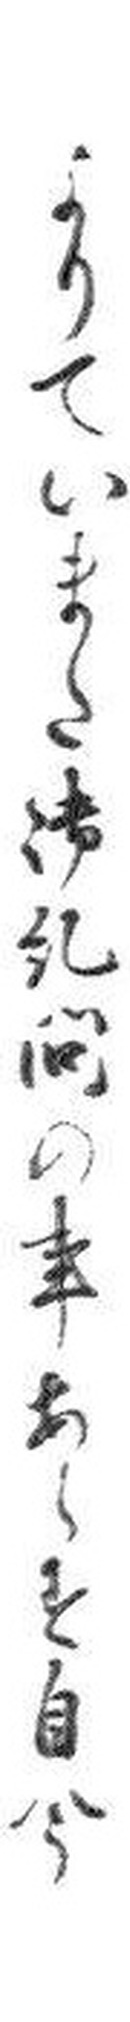よりていまた御糺問の事あらす自今
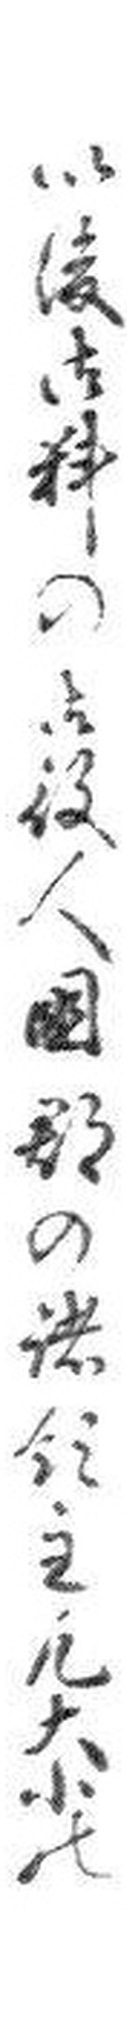以後御料の御役人国郡の諸領主凡大小の
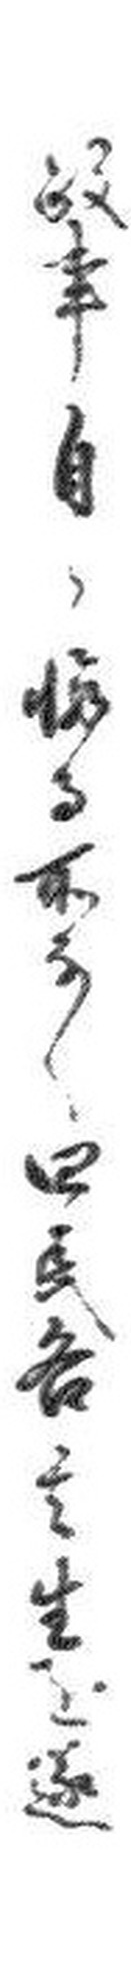政事自ら懈る所なく四民各其生を遂
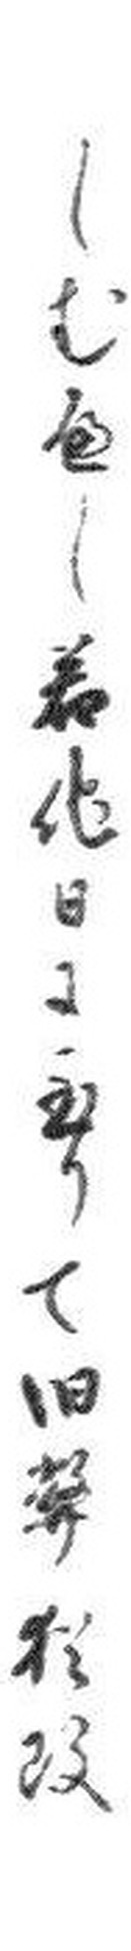しむへし若他日に至りて旧弊猶改
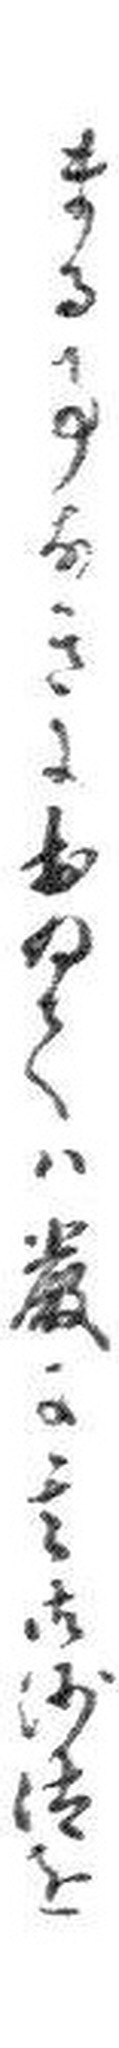まる事なきにおゐては厳に其御沙汰を
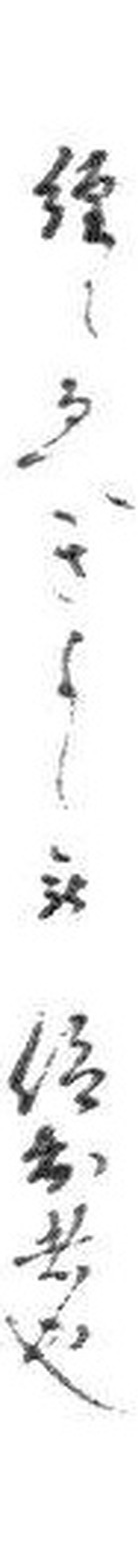経らるへきよし被仰出者也
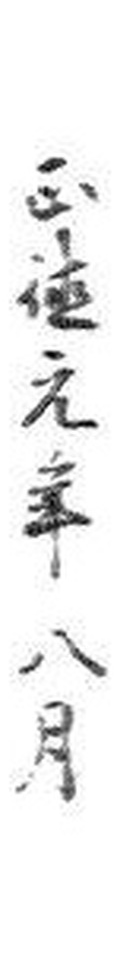正徳元年八月
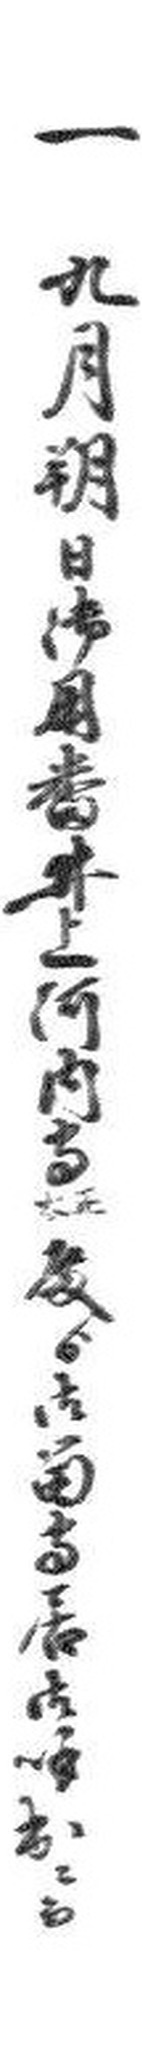一九月朔日御用番井上河内守正岑殿ゟ御留守居御呼出ニ而
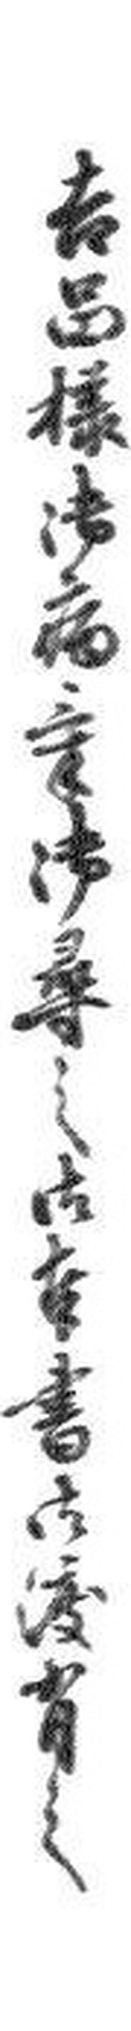吉品様御病気御尋之御奉書御渡有之

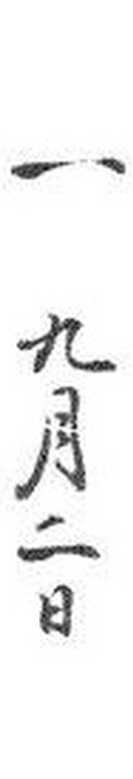一九月二日
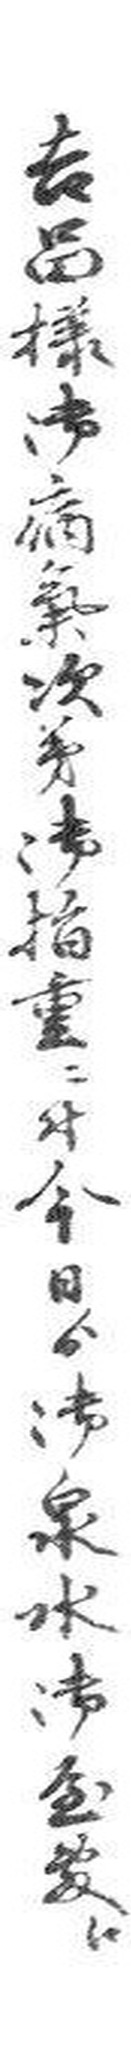吉品様御病気次第御指重ニ付今日ゟ御泉水御屋敷江
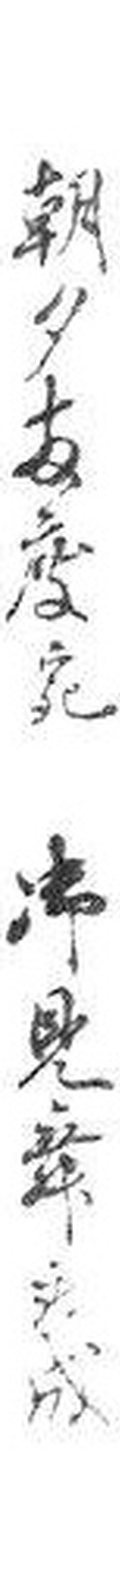朝夕両度宛御見舞被成
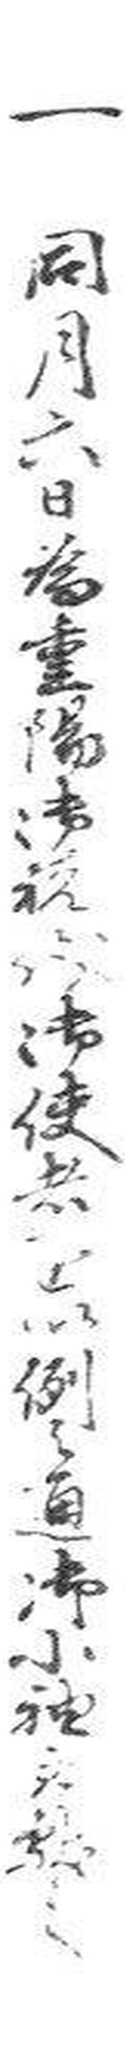一同月六日為重陽御祝儀御使者を以例之通御小袖被献之
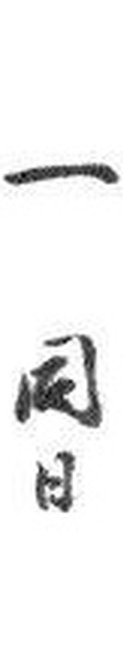一同日
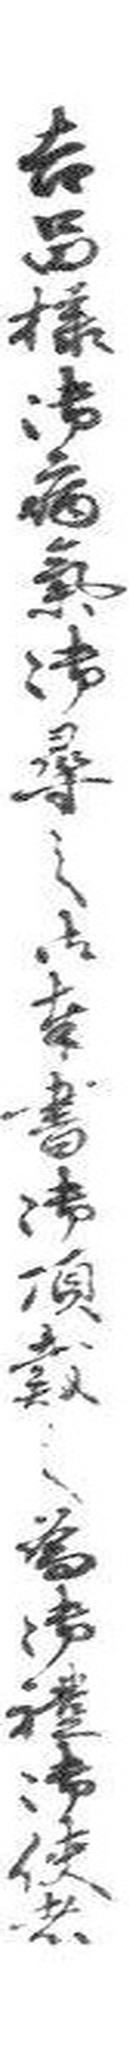吉品様御病気御尋之御奉書御頂戴之為御礼御使者
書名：家譜 二十八 吉邦公 従宝永七年七月五日到正徳元年十二月
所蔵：福井県文書館 Fukui Prefectural Archives
